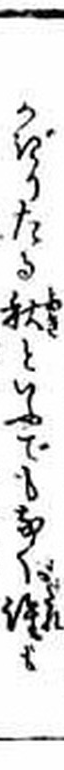かぎりたる秋といふでもなく誰も
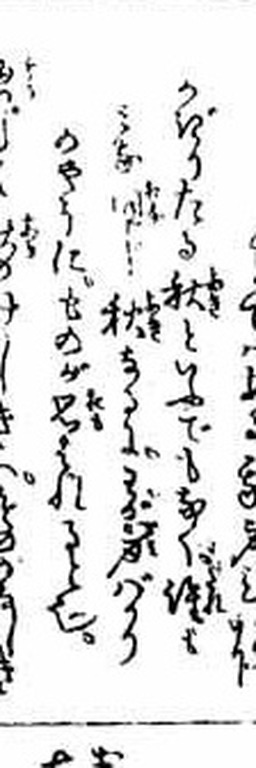みな同じ秋なるに我身ばかり
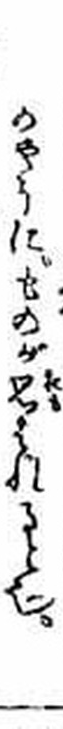のやうにものが思はれると也大
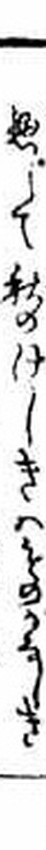惣じて秋のけしきはものがなしき江
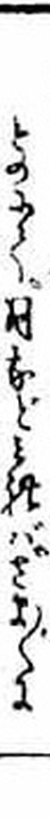ものにて月などみればさま〴〵に千里
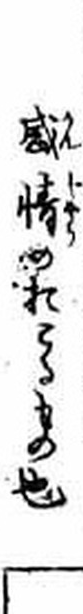感情のおこるもの也

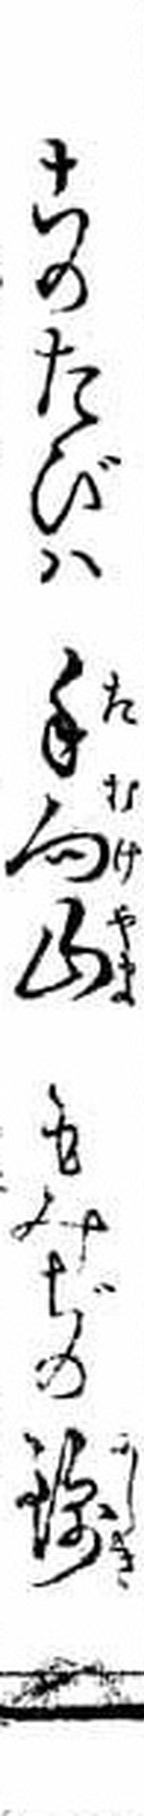このたびは手向山もみぢの錦
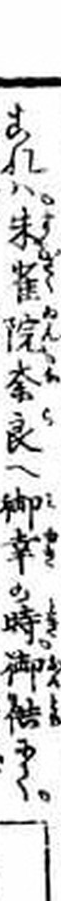これは朱雀院奈良へ御幸の時御供にて
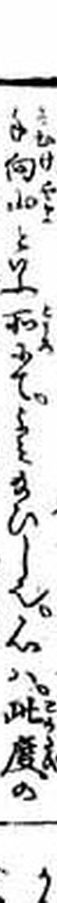手向山といふ所にてよみ給ひし也心は此度の
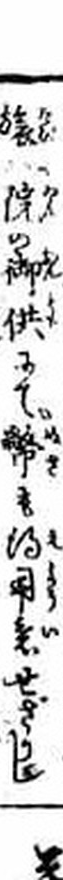旅は院の御供にて幣も得用意せざりし菅家
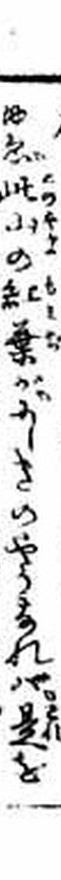ゆゑ此山の紅葉がにしきのやうなれば是を
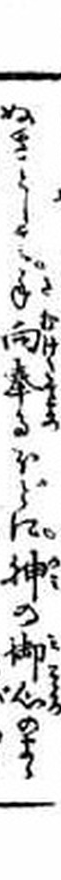ぬさとして手向奉るほどに神の御心のまゝ
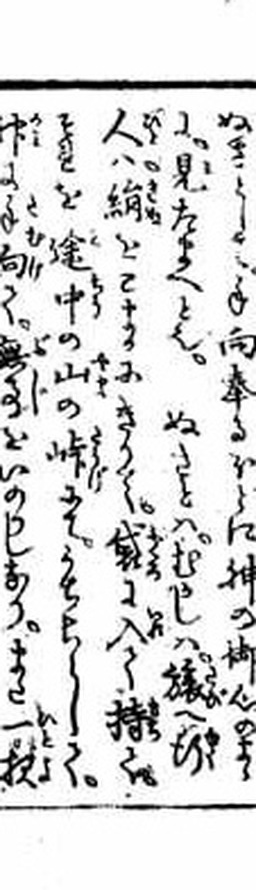人は絹をこまかにきりて袋に入れて持て
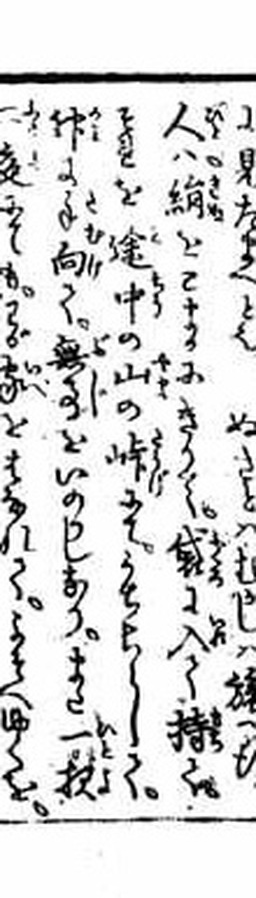それを途中の山の峠にてうちちらして
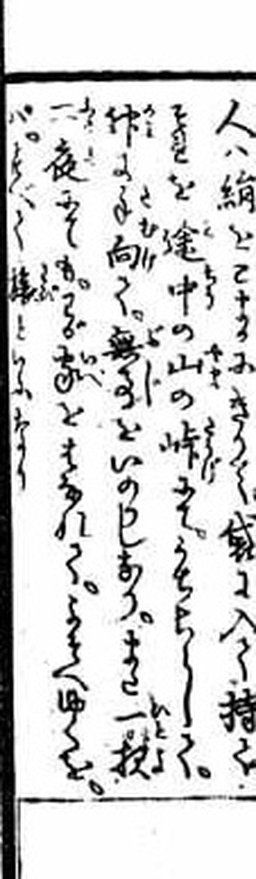神に手向て無事をいのりしなりまた一夜
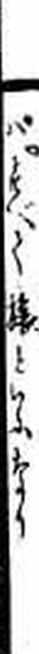ばすべて旅といふなり
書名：小倉百人一首
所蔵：東京学芸大学教育コンテンツアーカイブ
